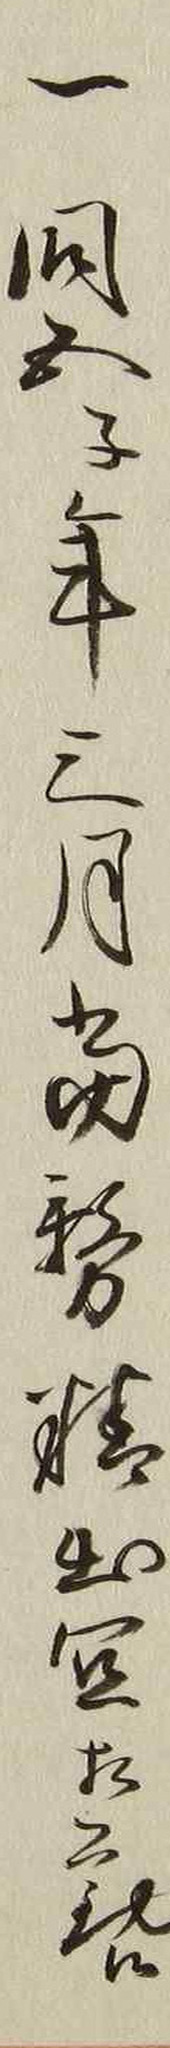一同五子年三月当務精出宜相勤候
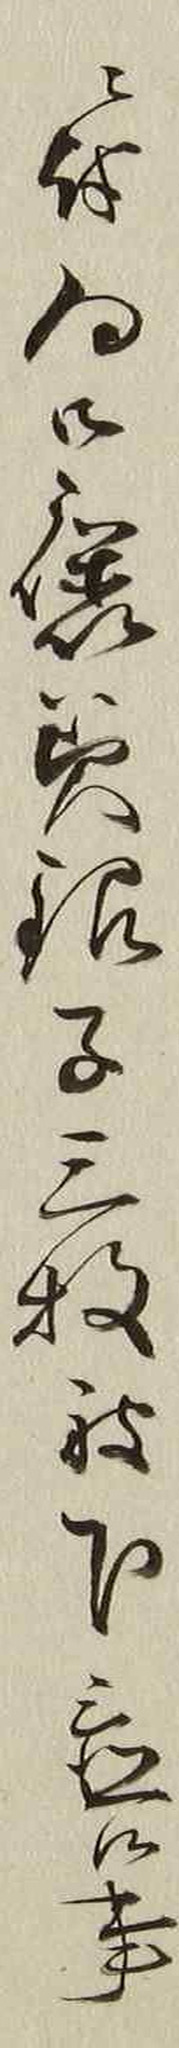ニ付為御褒美銀子三枚被下置候事
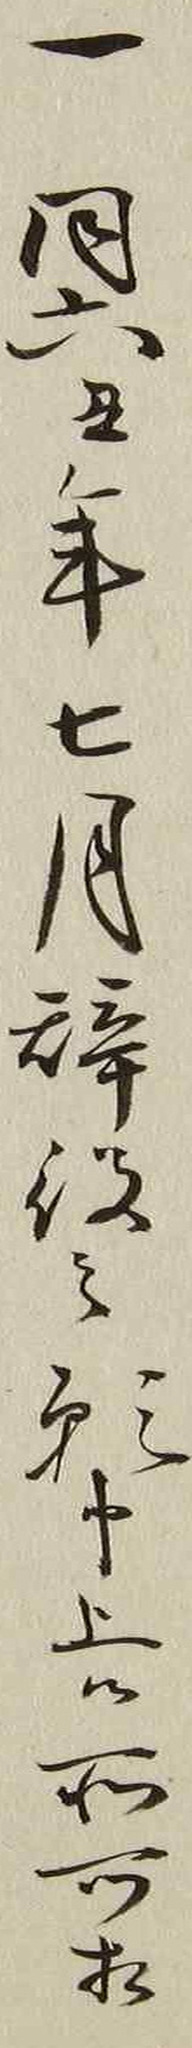一同六丑年七月辞役之願申上候所可相
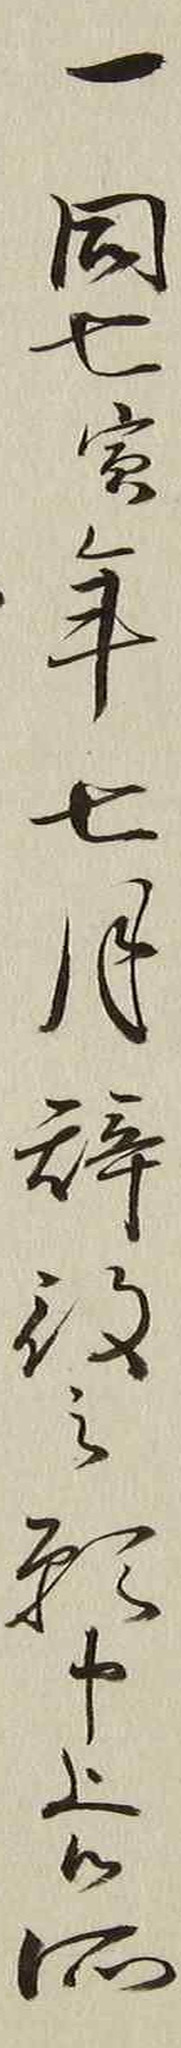一同七寅年七月辞役之願申上候所
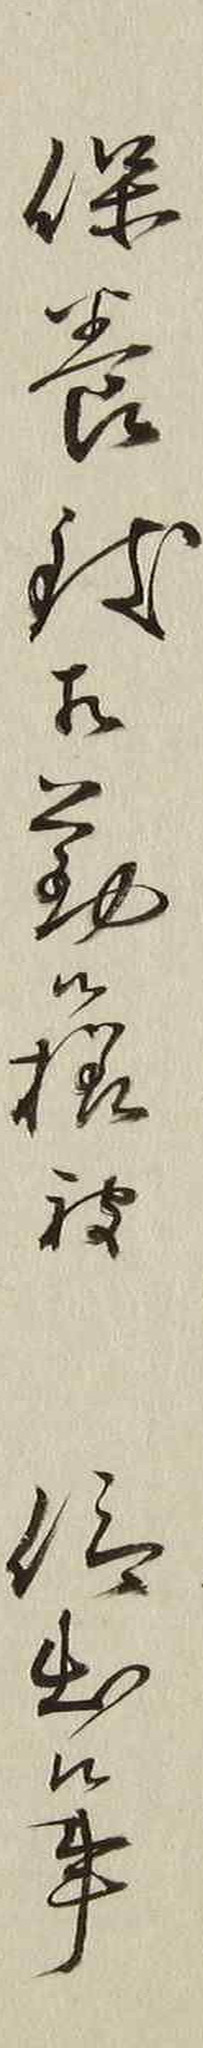保養致相勤候様被仰出候事
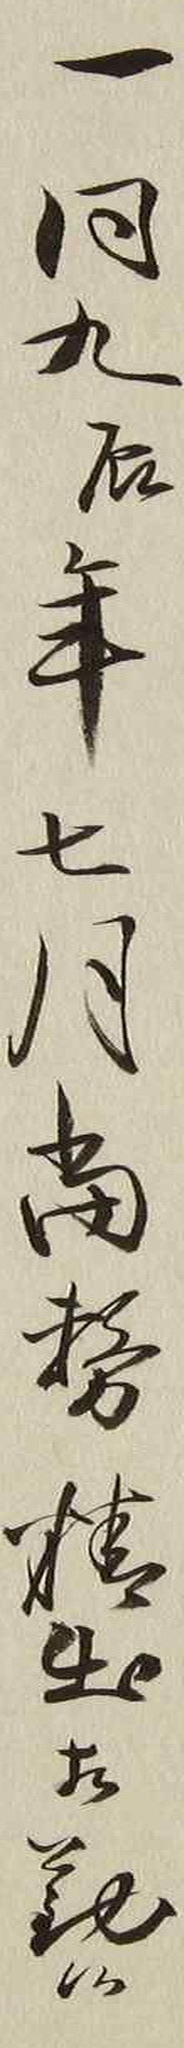一同九辰年七月当務精出相勤候
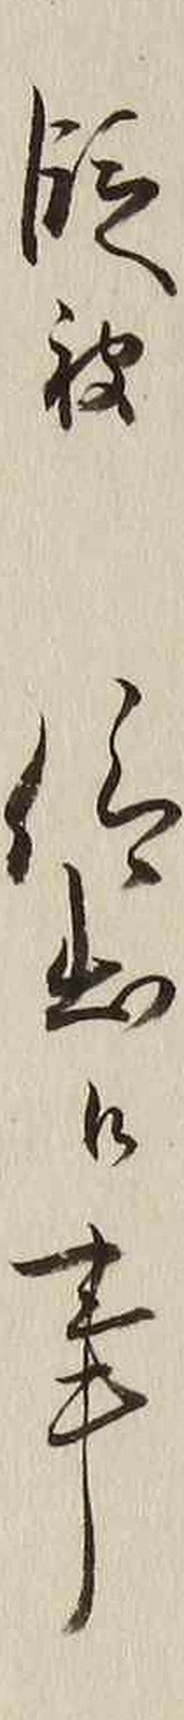段被仰出候事
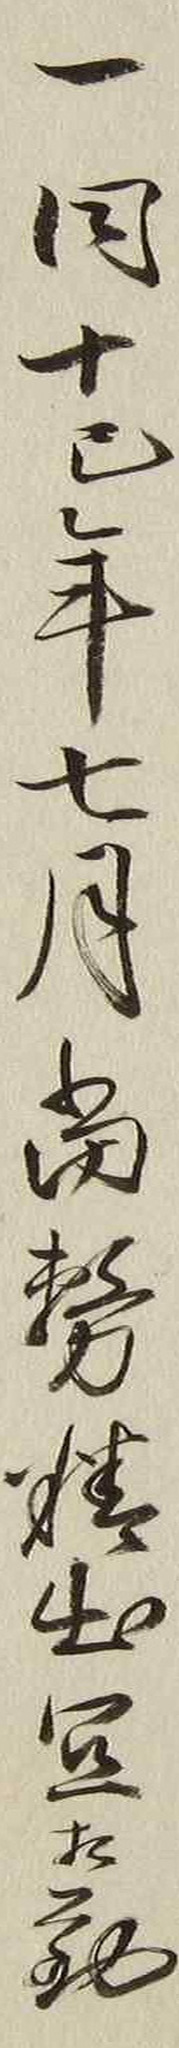一同十巳年七月当務精出宜相勤
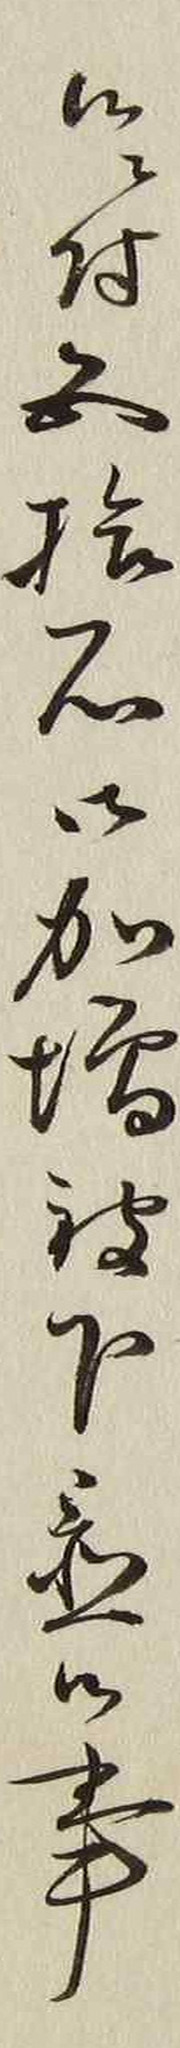候ニ付五拾石御加増被下置候事
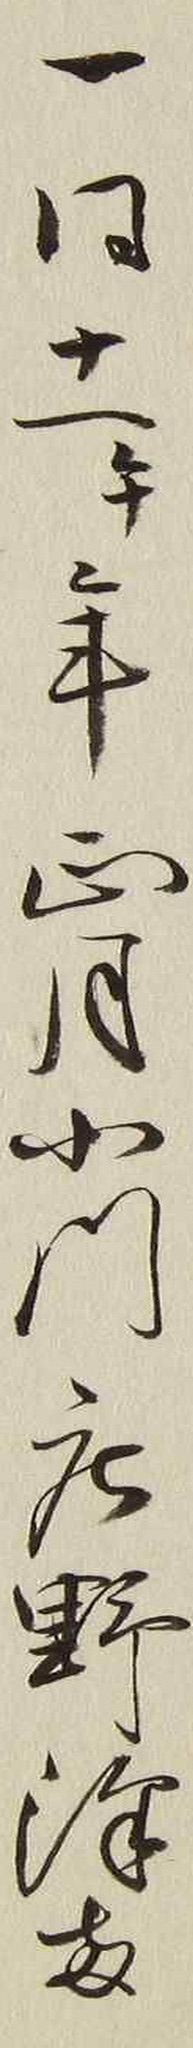一同十一午年正月小川庄野沢両
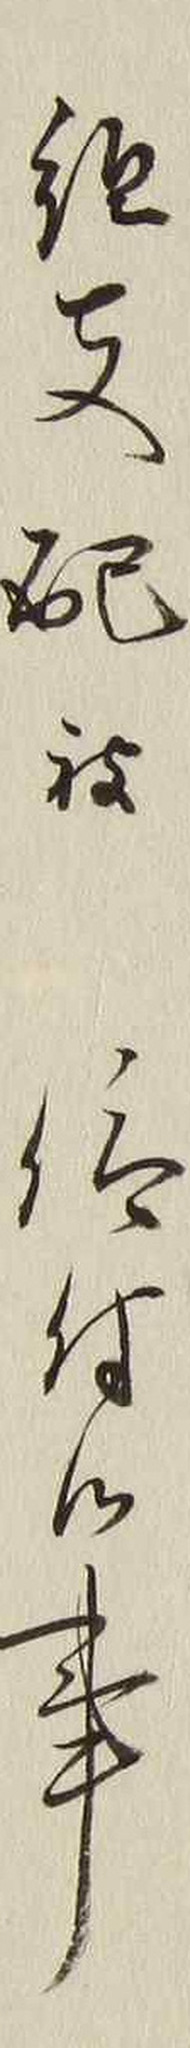組支配被仰付候事
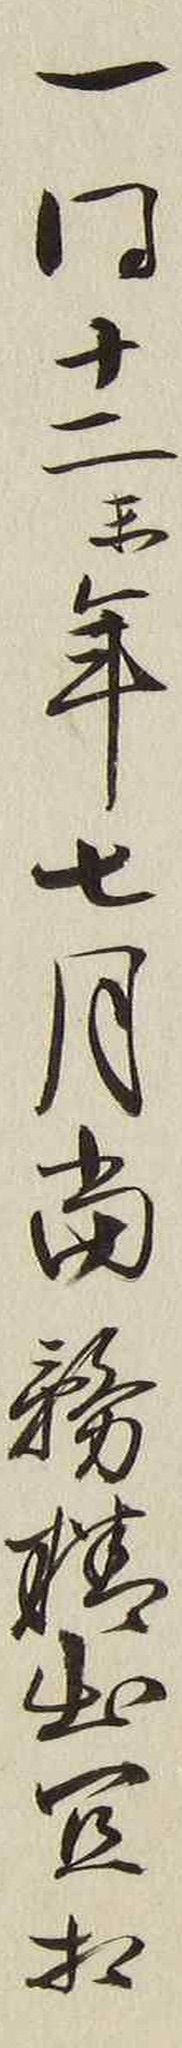一同十二未年七月当務精出宜相
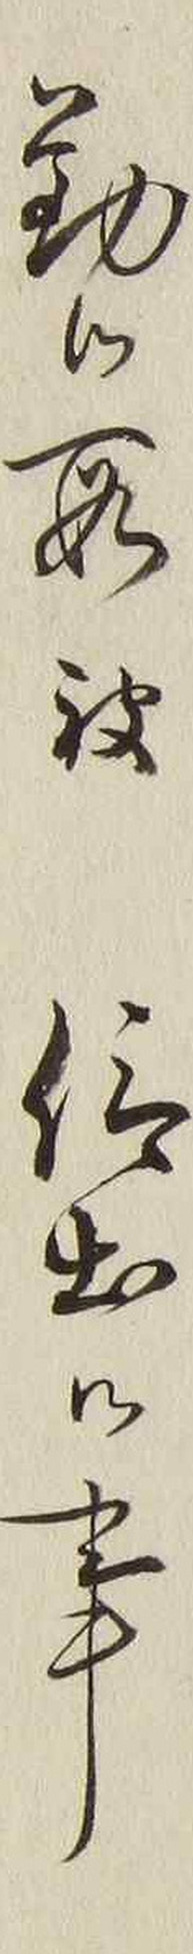勤候段被仰出候事

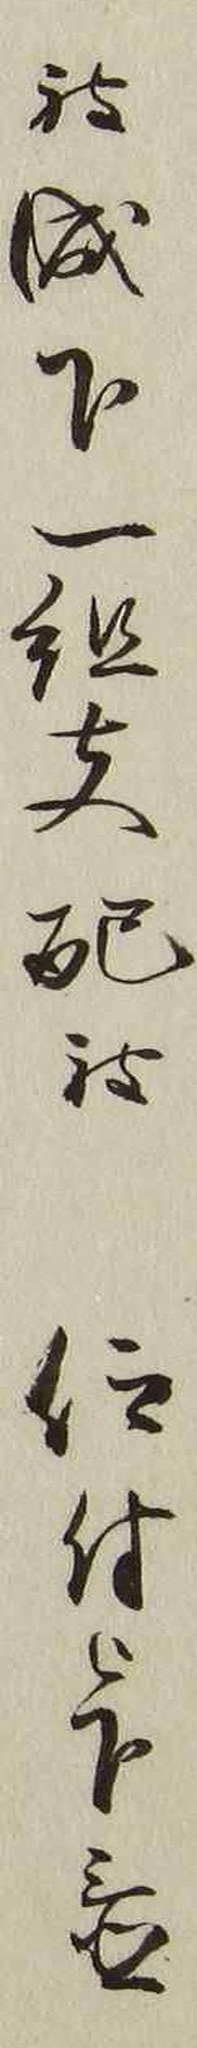被成下一組支配被仰付被下置
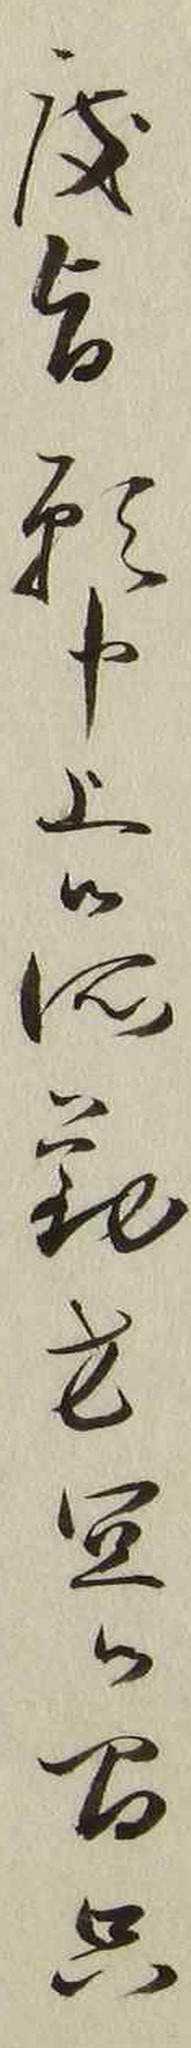度旨願申上候所勤方宜候間只
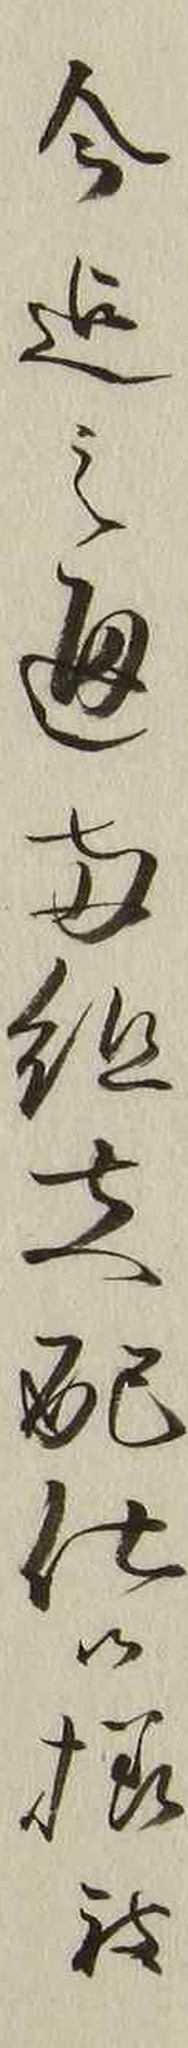今迄之通両組支配仕候様被
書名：諸士系譜　巻之163　な之部5
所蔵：会津若松市立会津図書館
